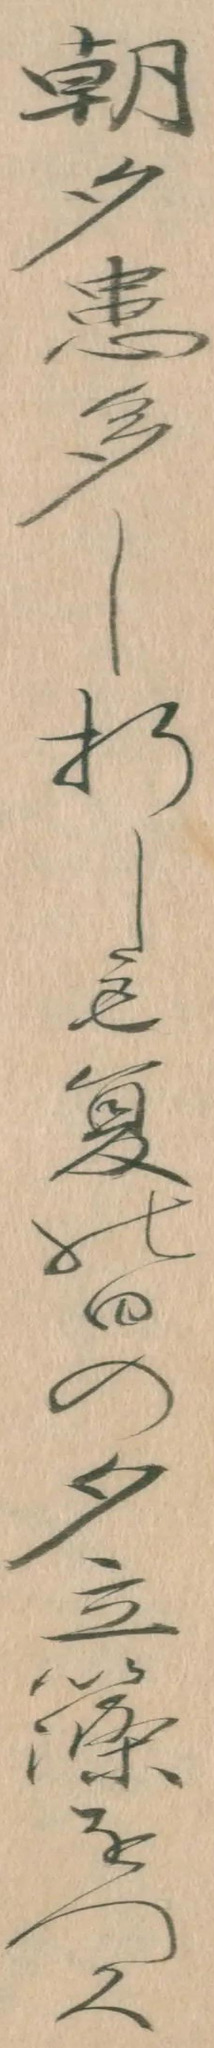朝夕患多し折しも夏の日の夕立篠をつく
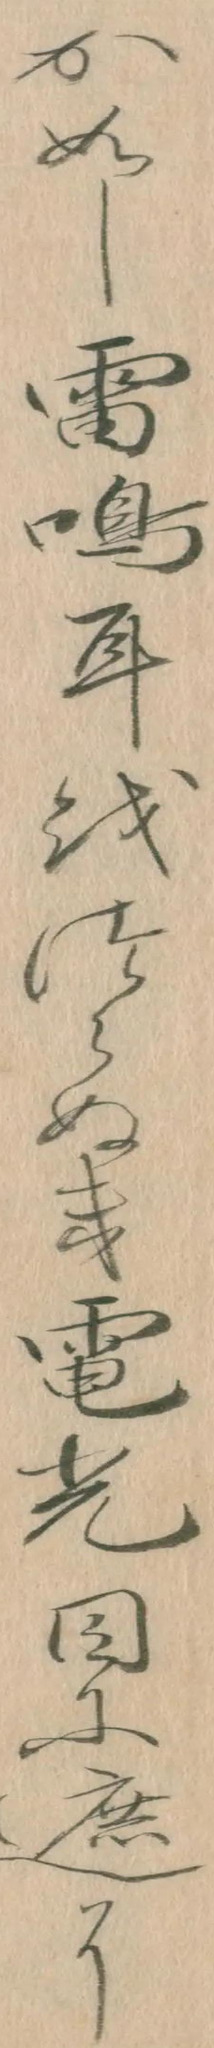か如し雷鳴耳をつらぬき電光目に遮に
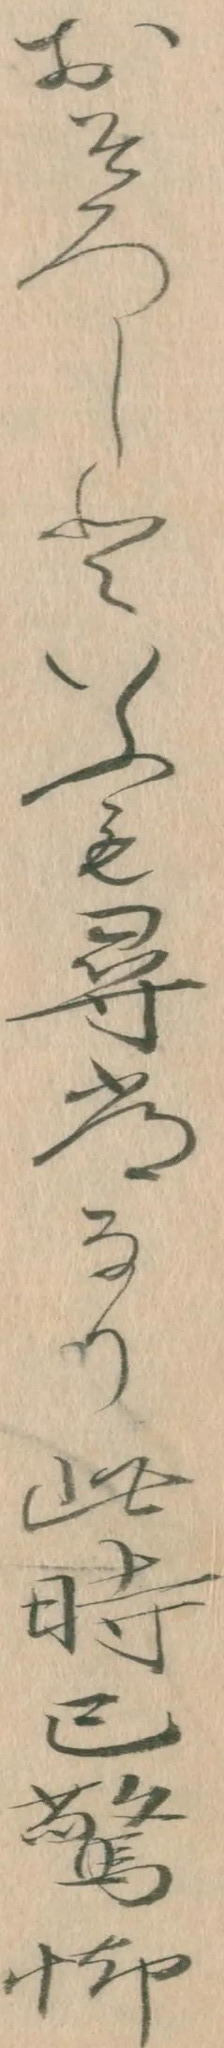おそろしといふも尋常なり此時己驚怖
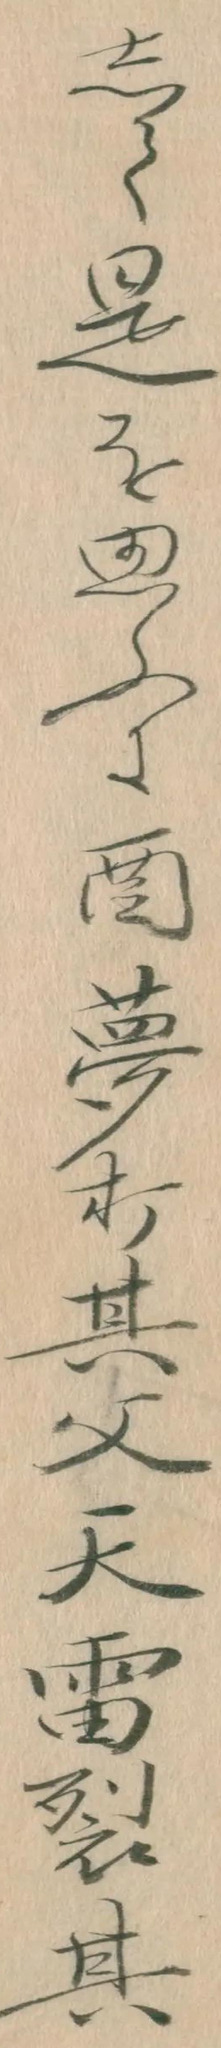して是を思ふに酉夢打其父天雷裂其
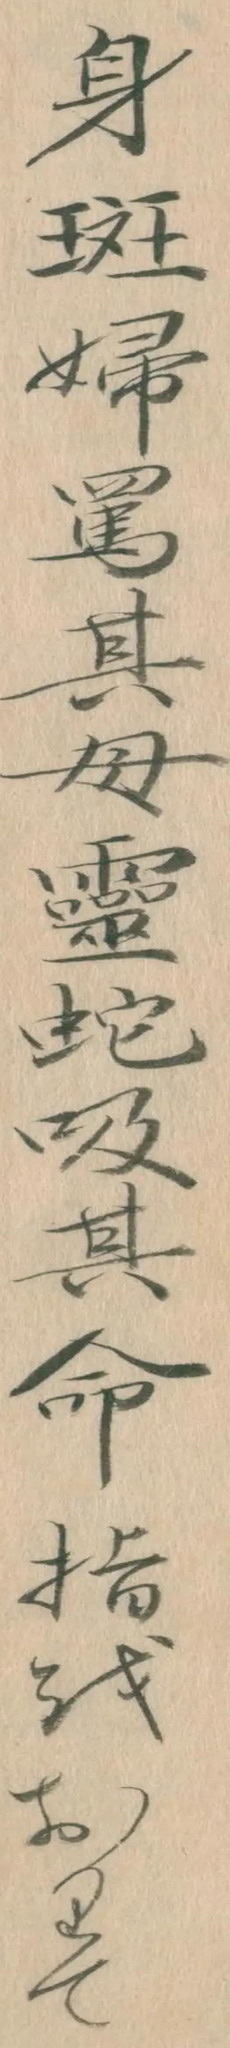身斑婦罵其母霊蛇吸其命指をおりて
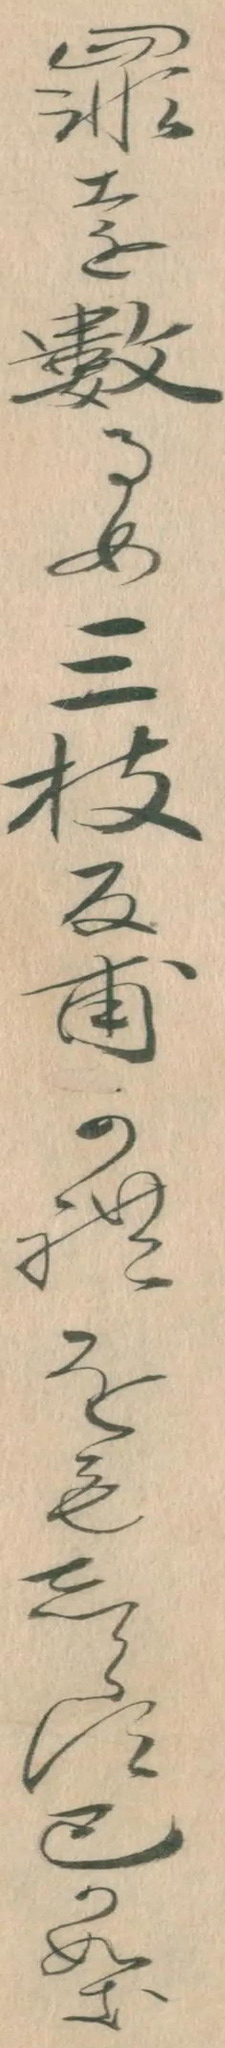罪を数るに三枝反甫の礼をもしらす己か如き
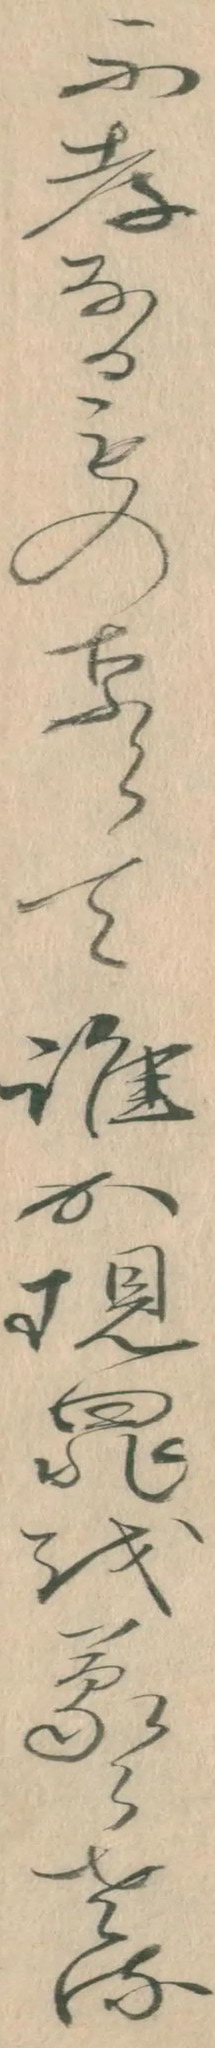不孝なるものならて誰か現罪を蒙らさる

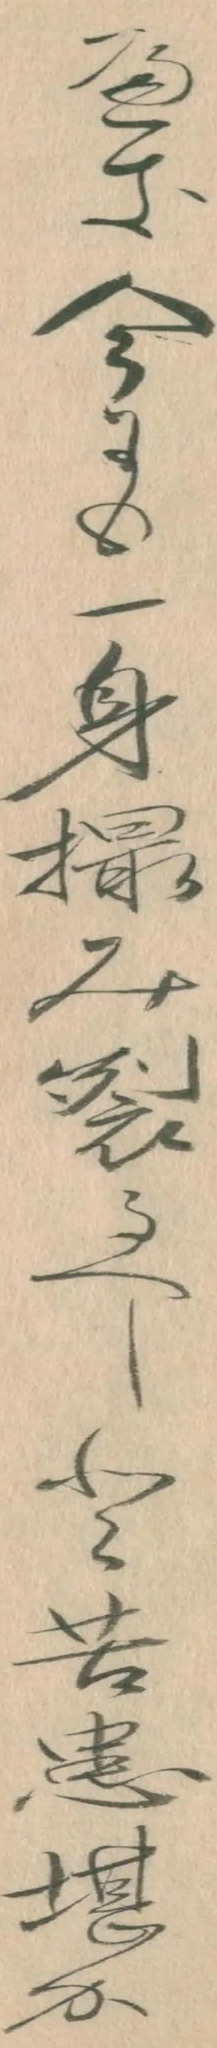へき今にも一身撮み裂るへしと苦患堪か
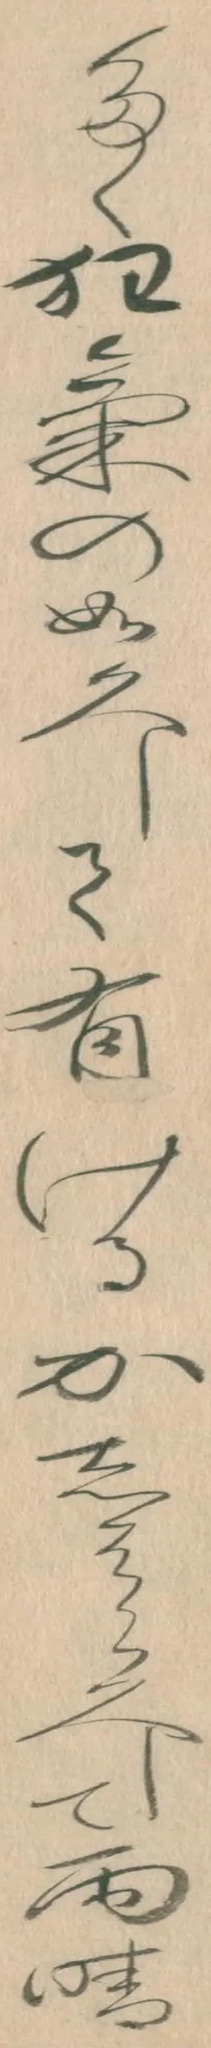たく狂気の如くして有けるかしはらくして雨晴
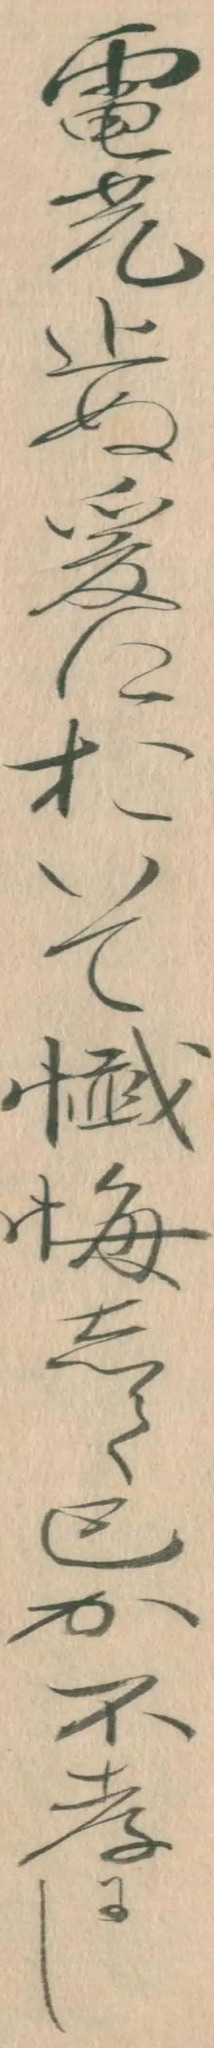電光止ぬ爰において懺悔して己か不孝にし
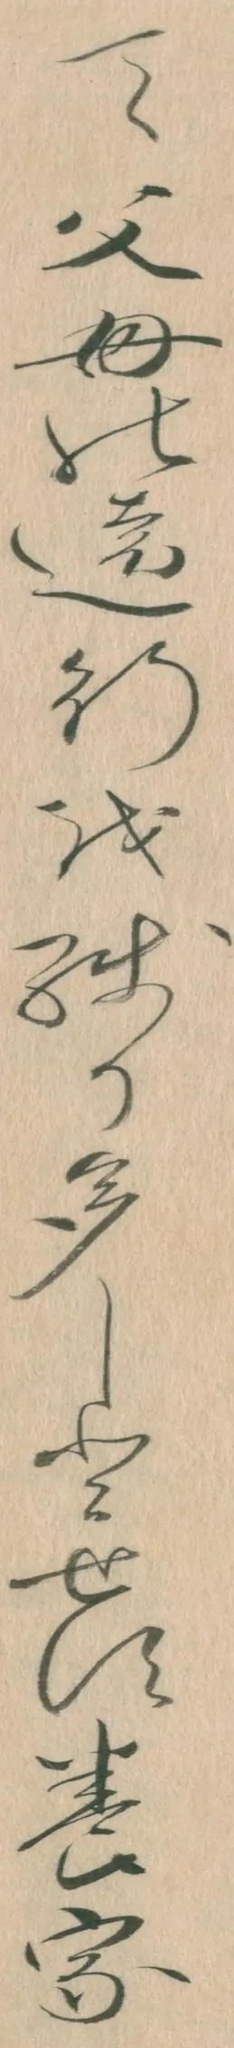て父母の遠行を残り多しとせす養家
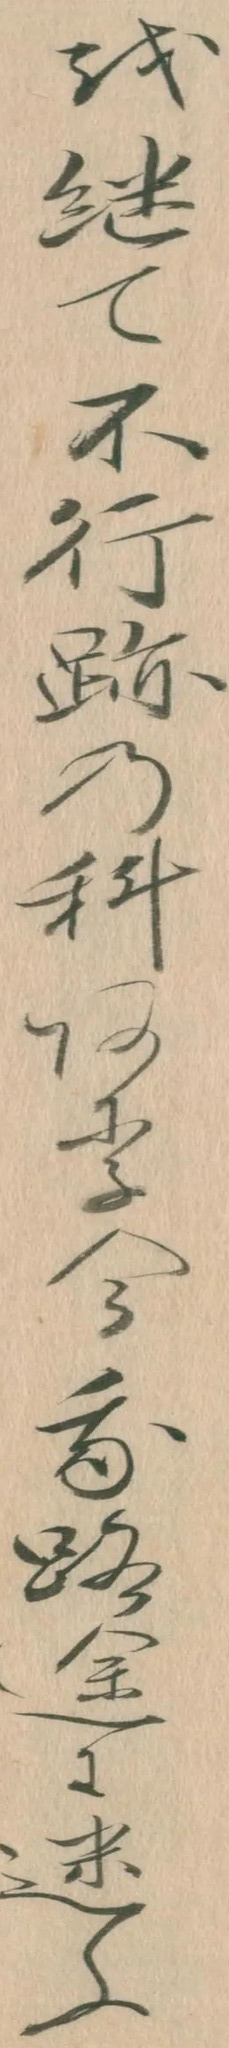を継て不行跡の科あり今我路途に迷ふ
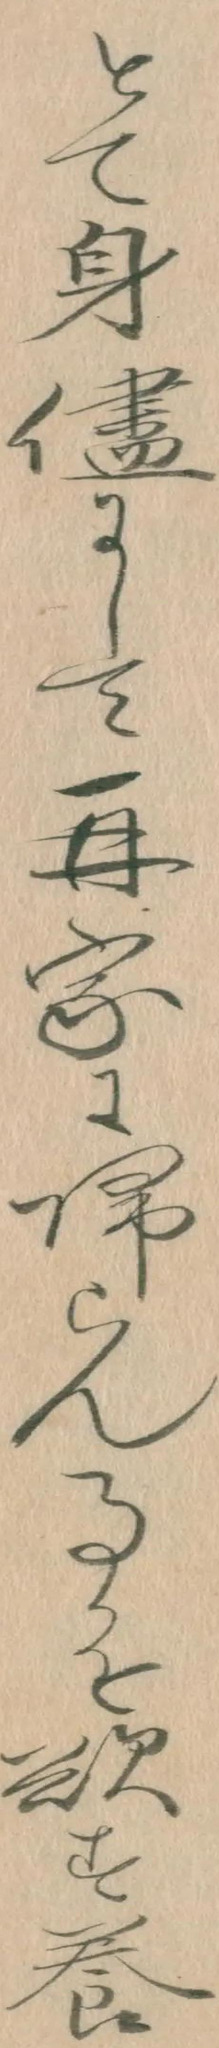とて身儘にして再家に帰らん事を欲す養
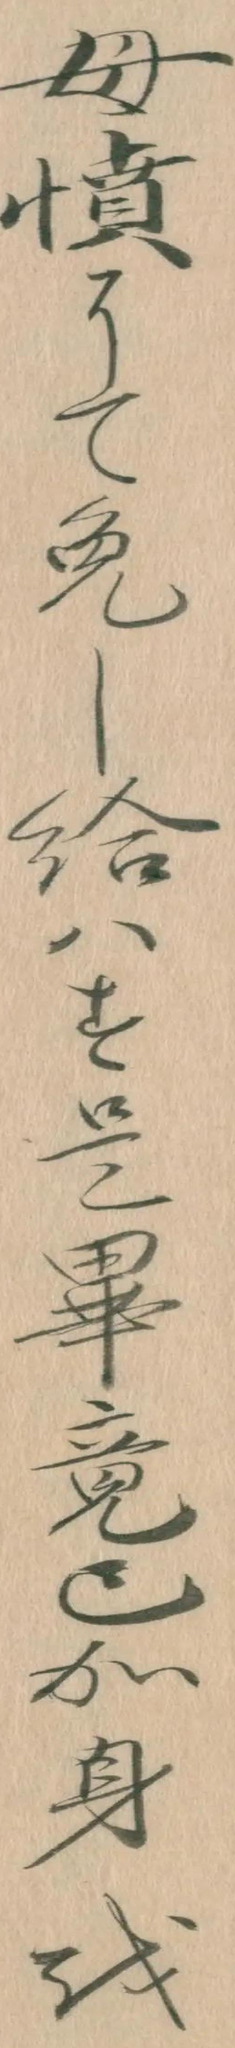母憤りて免し給ハす是畢竟己か身を
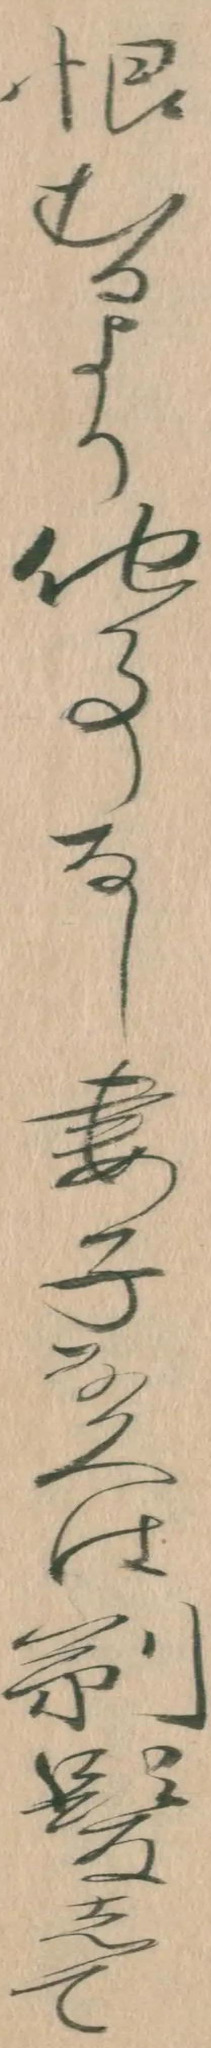恨むるより他事なし妻子なくは剃髪して
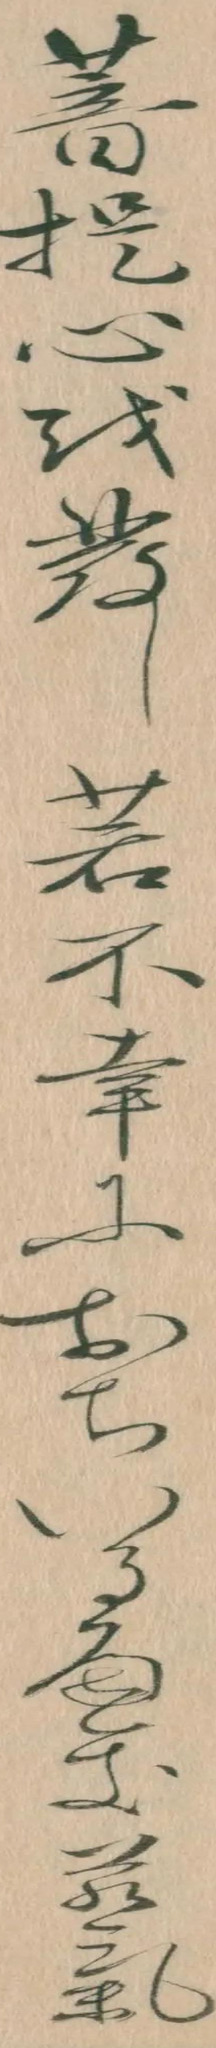菩提心を発し若不幸におちいるへき若気
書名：俗語之種. [1]
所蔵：国立国会図書館 National Diet Library, JAPAN
